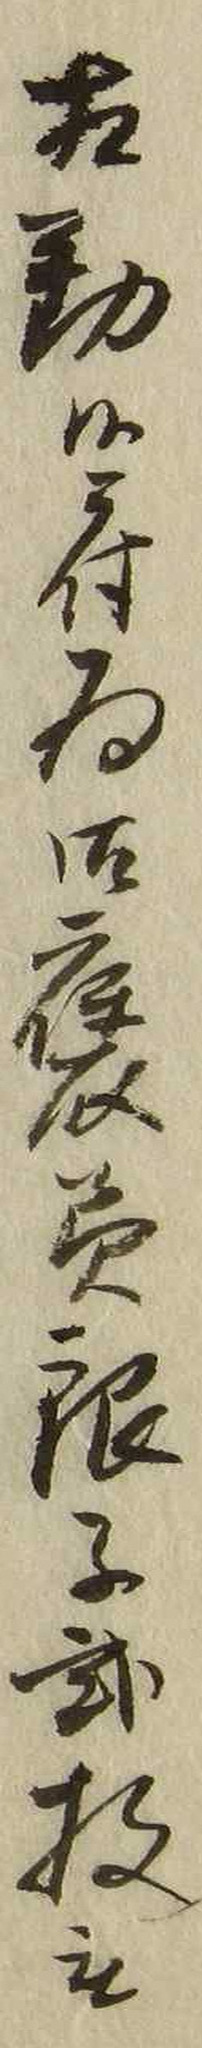相勤候ニ付為御褒美銀子弐枚被
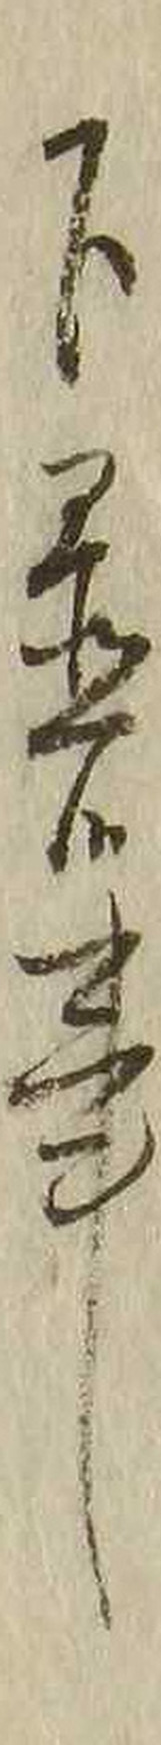下置候事
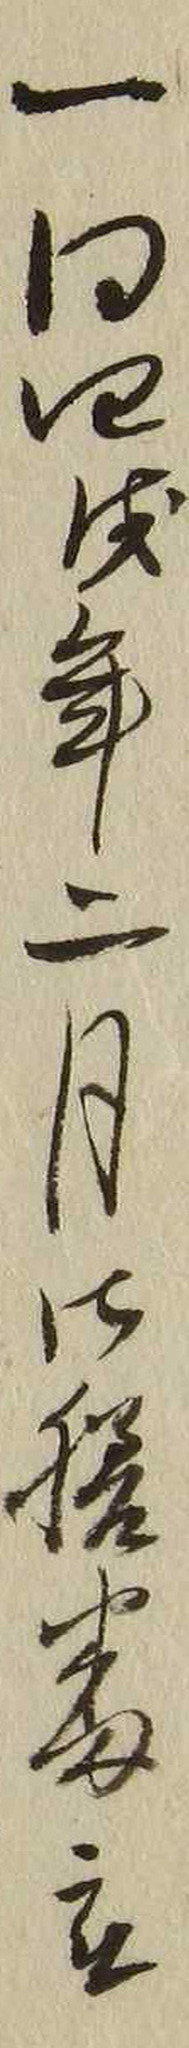一同四戌年二月御膳番被
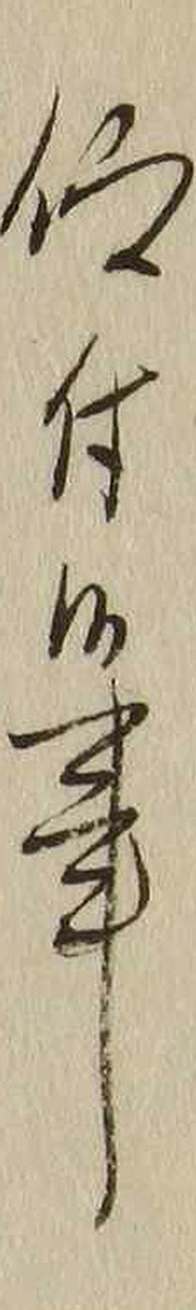仰付候事
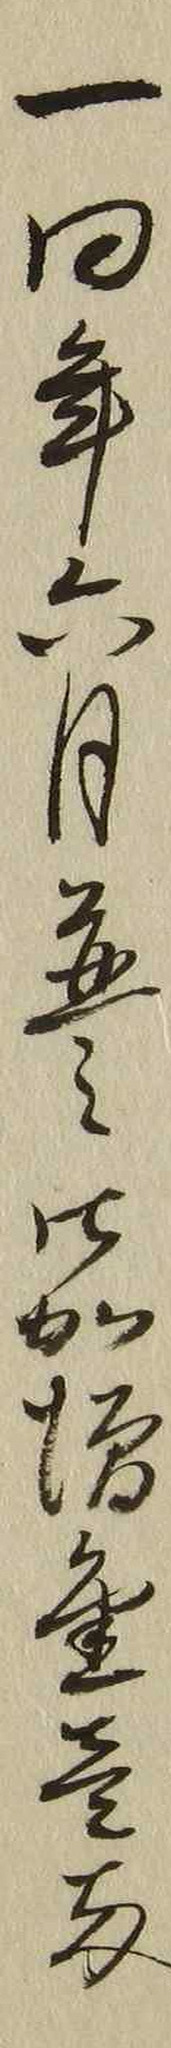一同年六月並之御加増金壱両
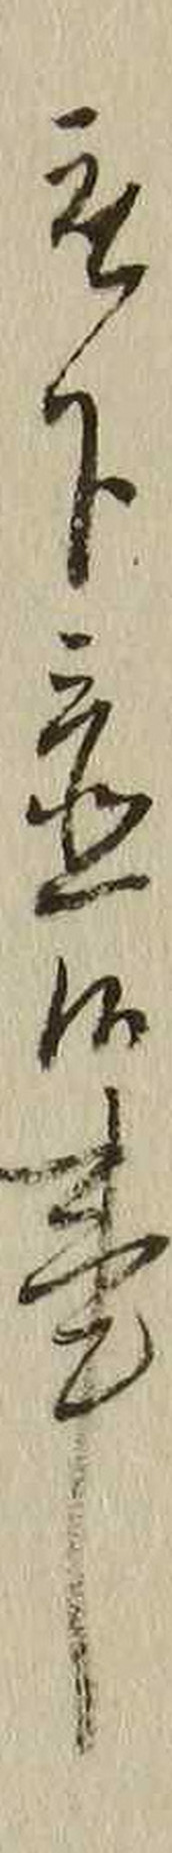被下置候事
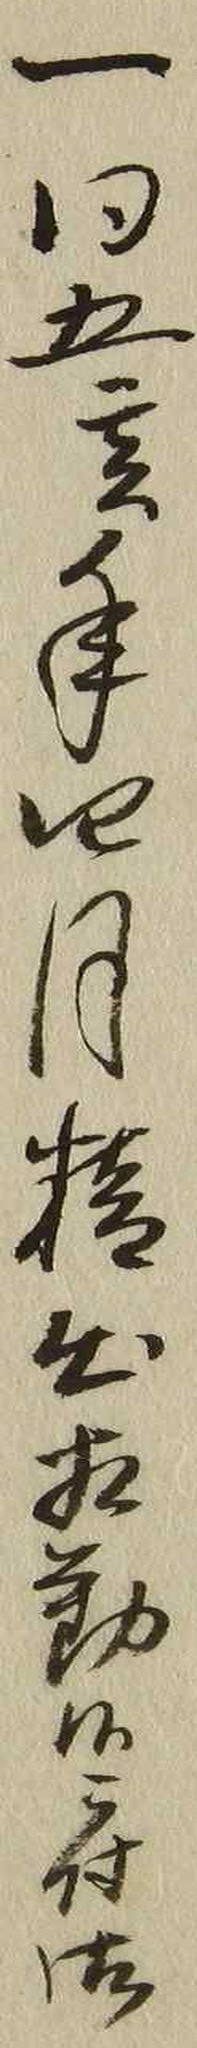一同五亥年四月精出相勤候ニ付御
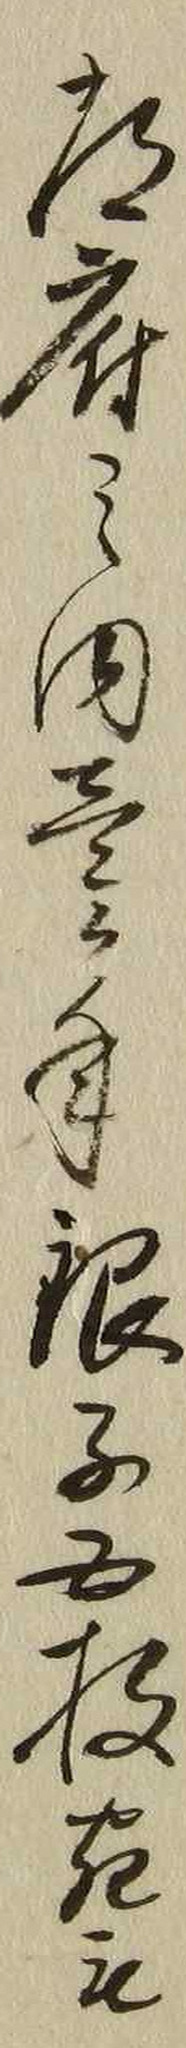常雇之内壱ケ年銀子五枚宛被
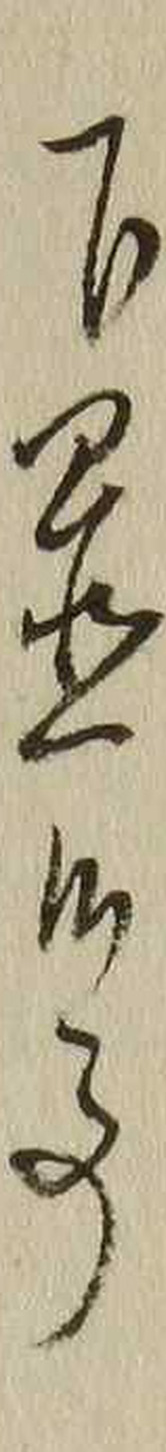下置候事
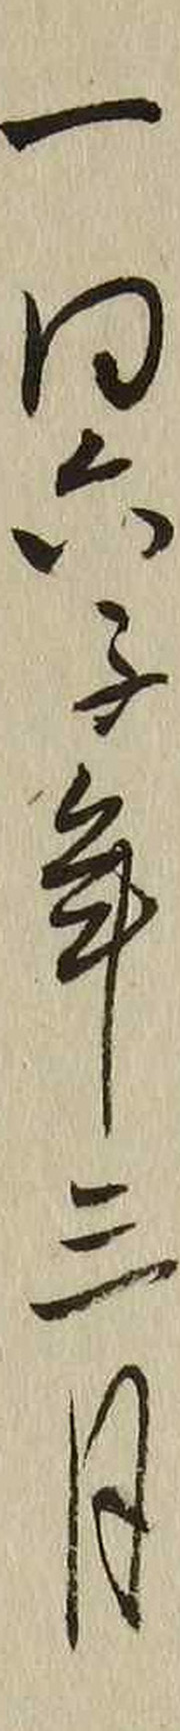一同六子年三月
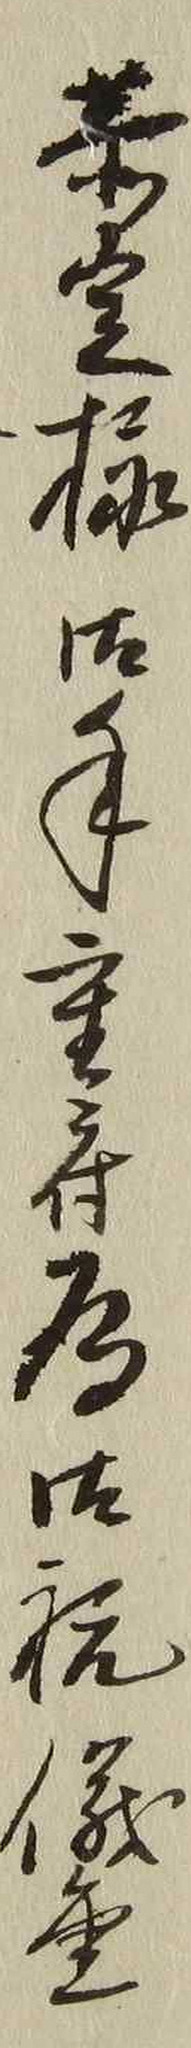恭定様御手重ニ付為御祝儀金
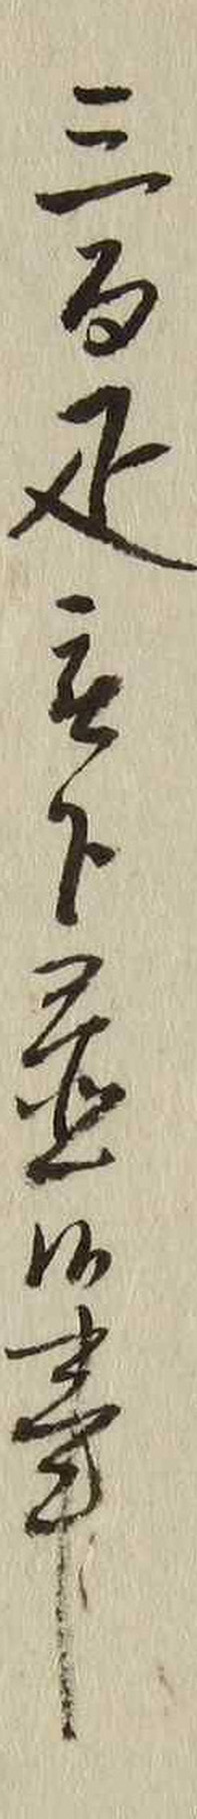三百疋被下置候事
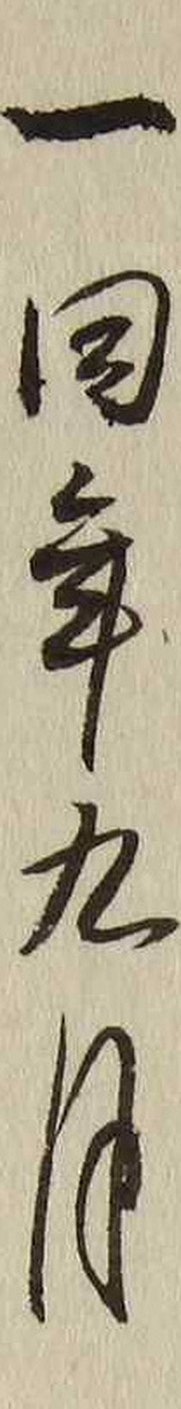一同年九月
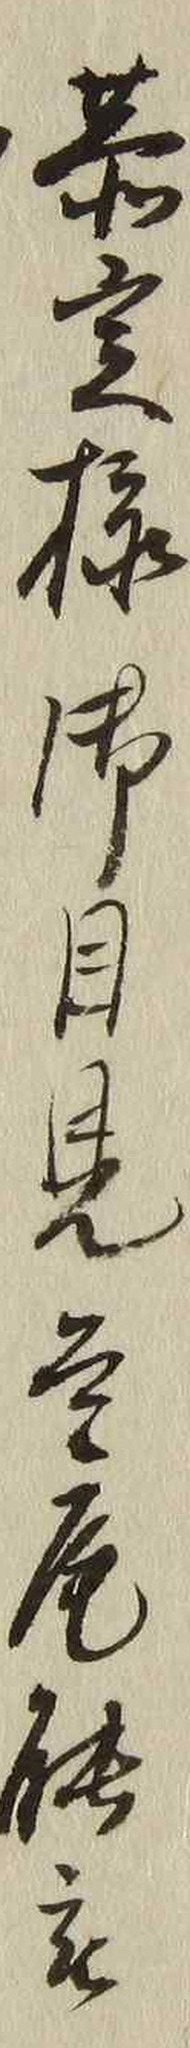恭定様御目見首尾能被
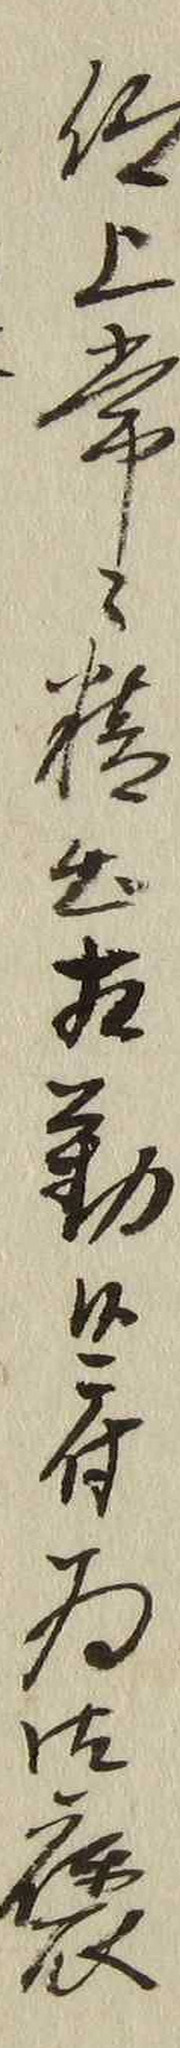仰上常々精出相勤候ニ付為御褒
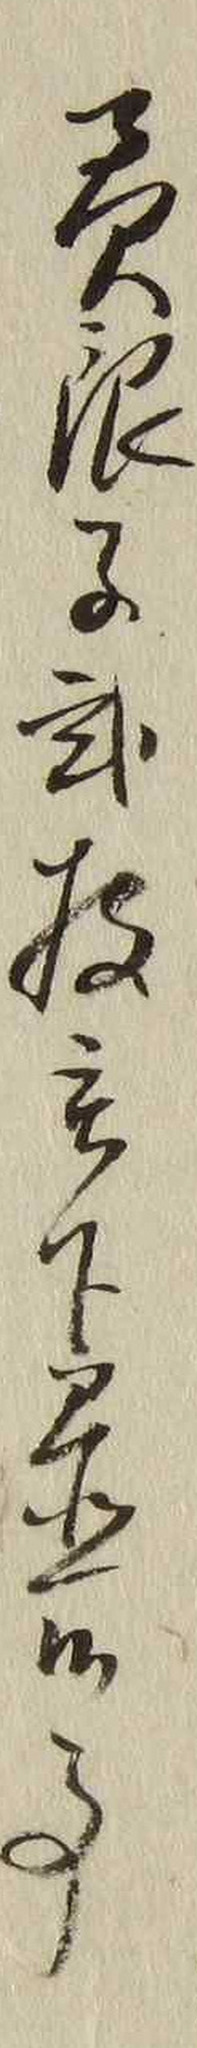美銀子弐枚被下置候事
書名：諸士系譜　巻之359　す之部9
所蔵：会津若松市立会津図書館
